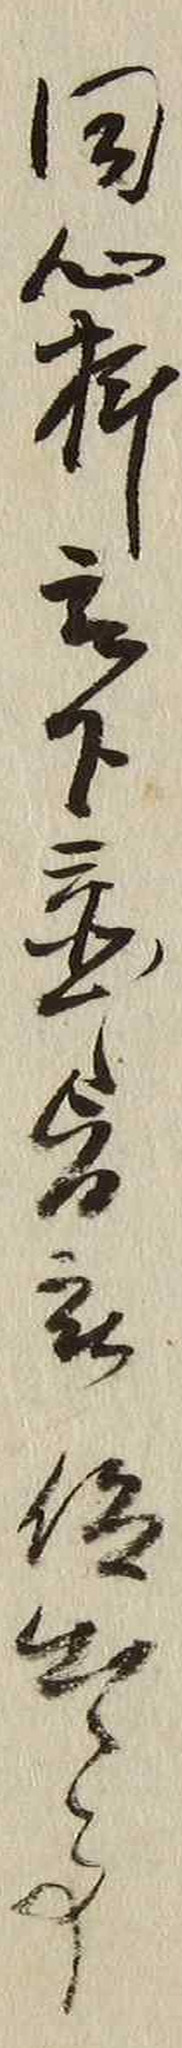同心料被下置候旨被仰出候事
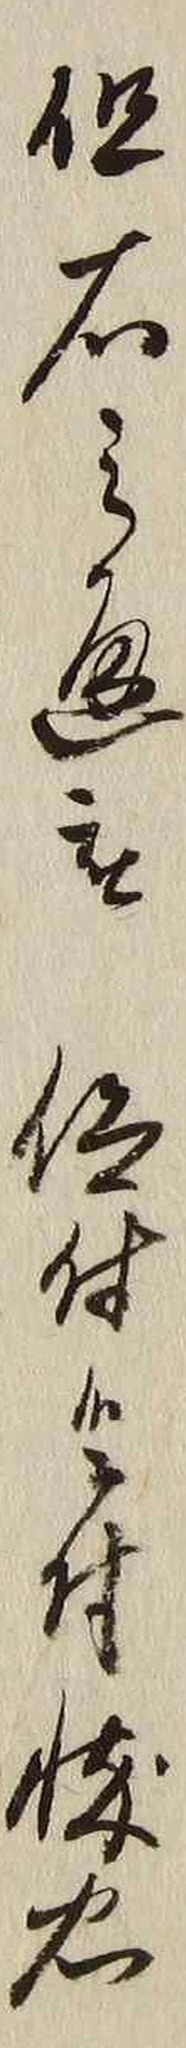但右之通被仰付候ニ付忰忠
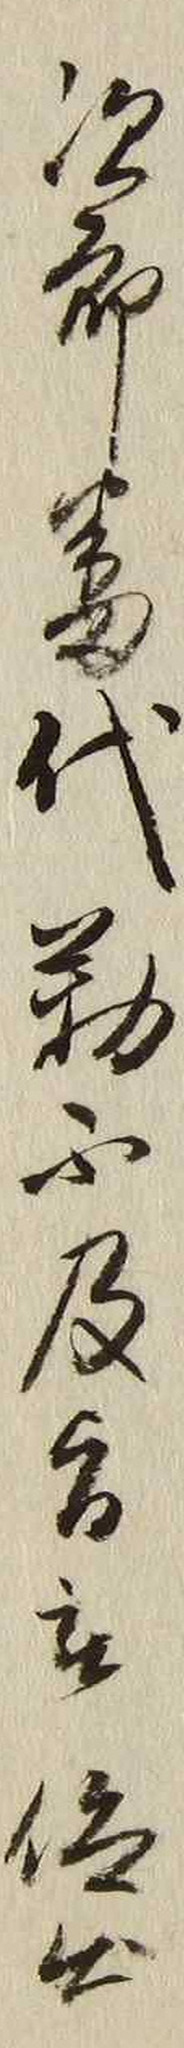次郎番代勤不及旨被仰出
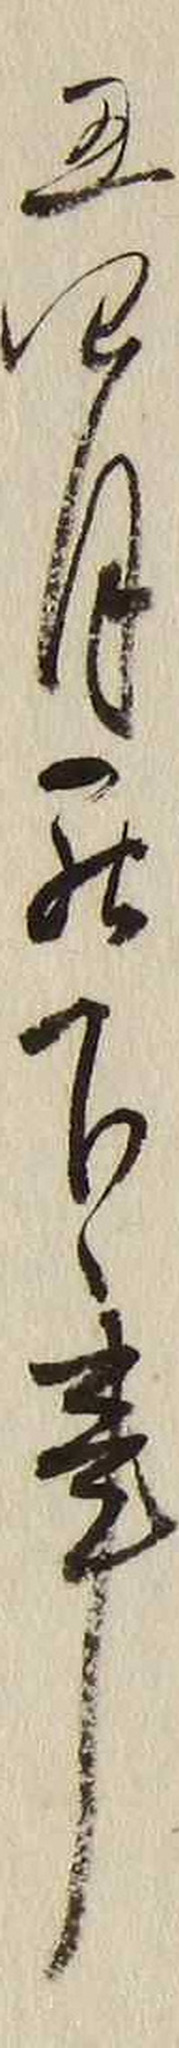丑四月罷下候事

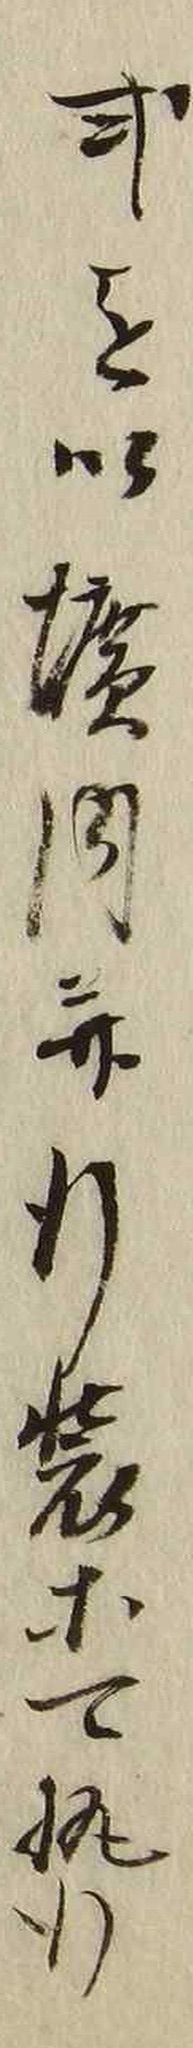式を以壙内并行装等可執行
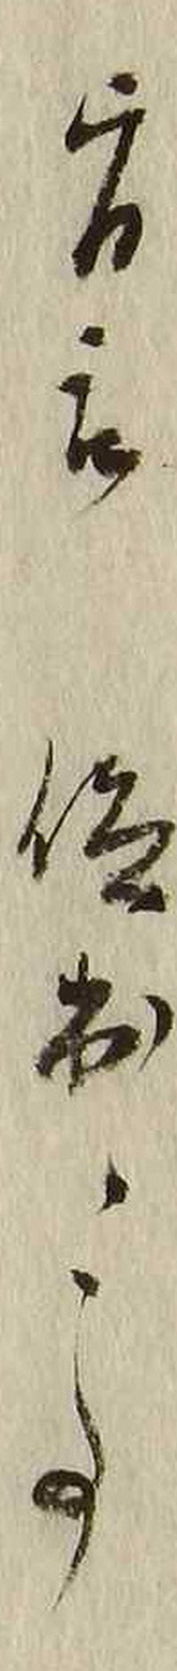旨被仰出候事
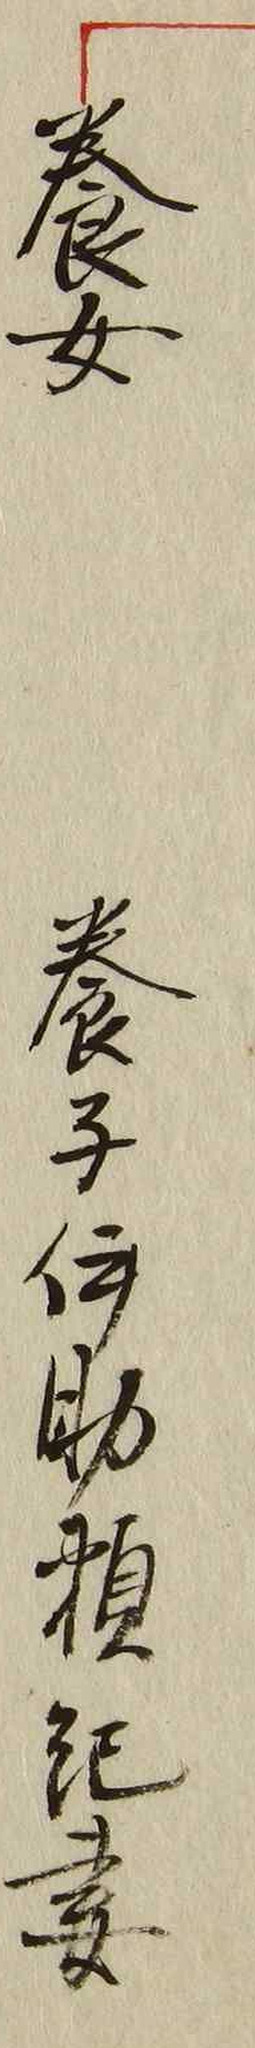養女養子伊助頼紀妻
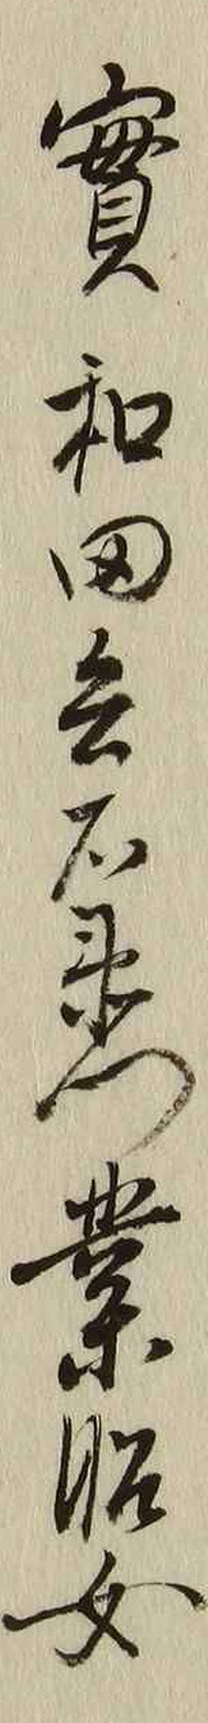実和田兵右衛門業昭女
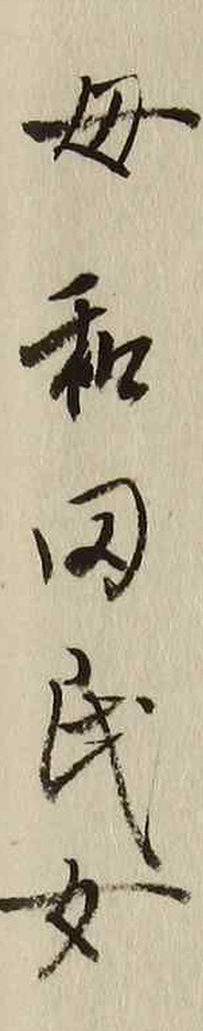母和田氏女
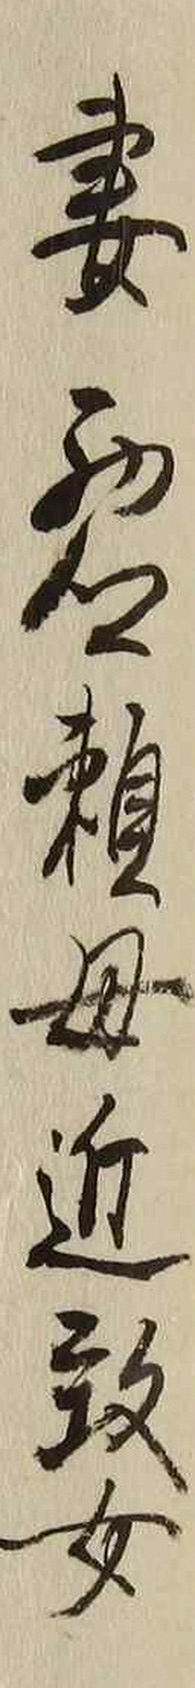妻西郷頼母近致女
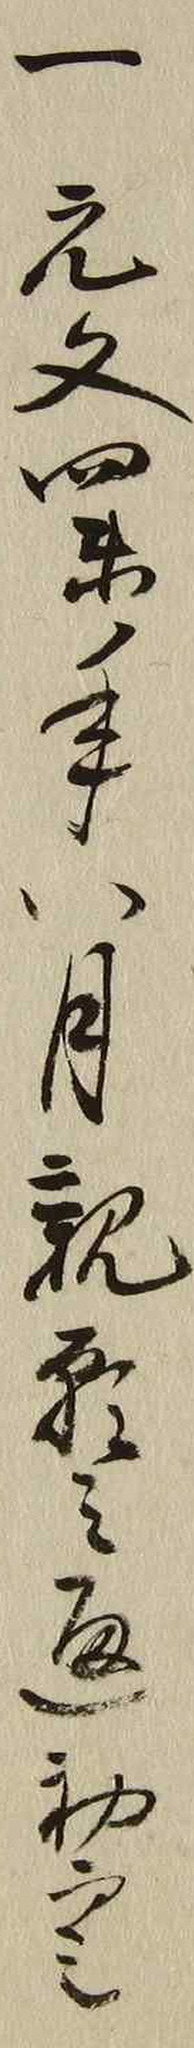一元文四未年八月親願之通初而之
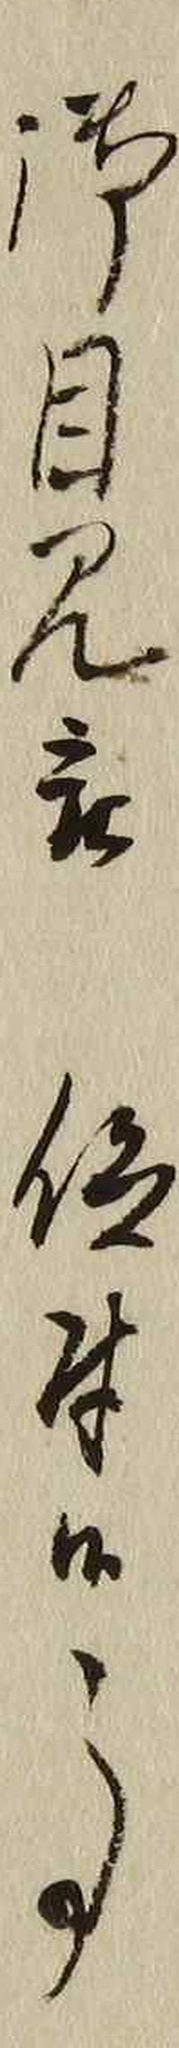御目見被仰付候事
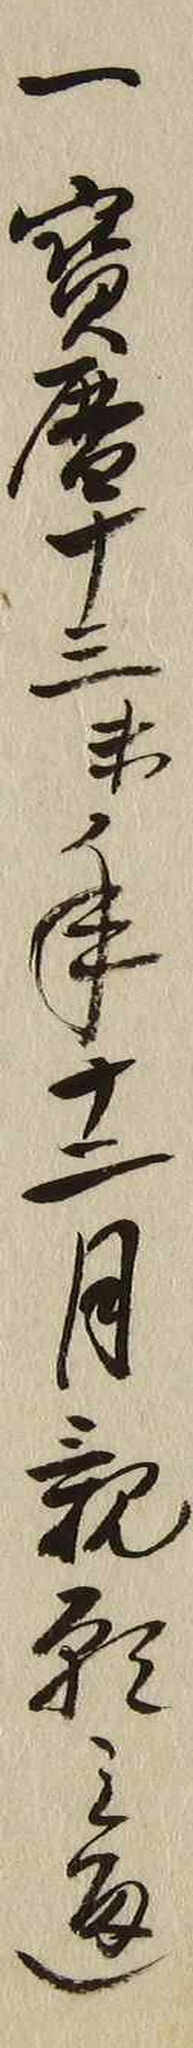一宝暦十三未年十二月親願之通
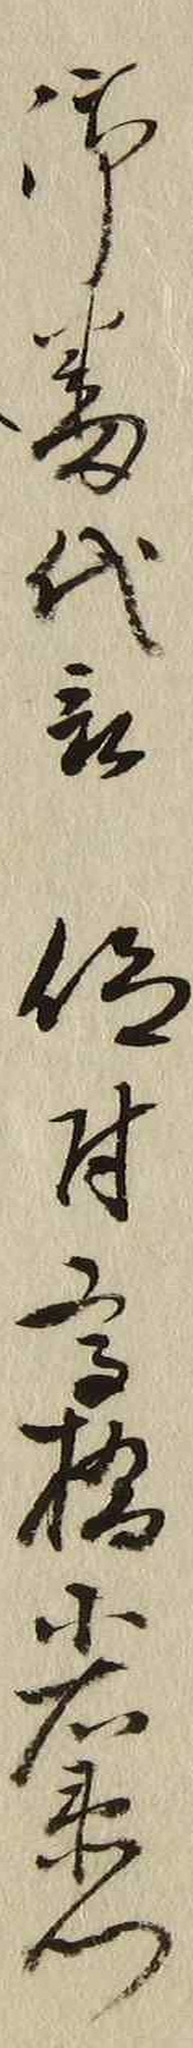御番代被仰付高橋小右衛門
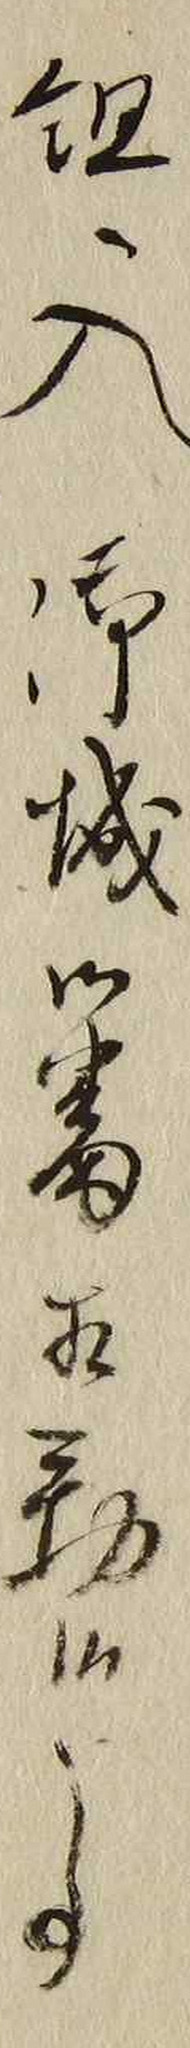組へ入御城御番相勤候事
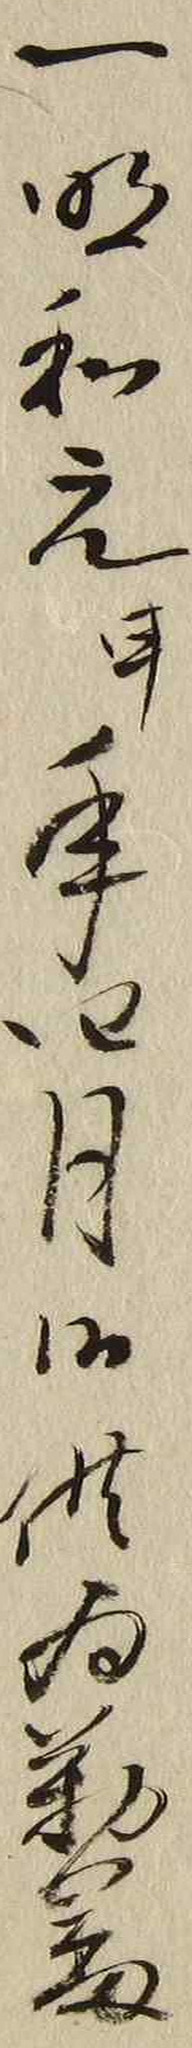一明和元申年四月御供為勤番
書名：諸士系譜　巻之351　す之部1
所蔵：会津若松市立会津図書館
